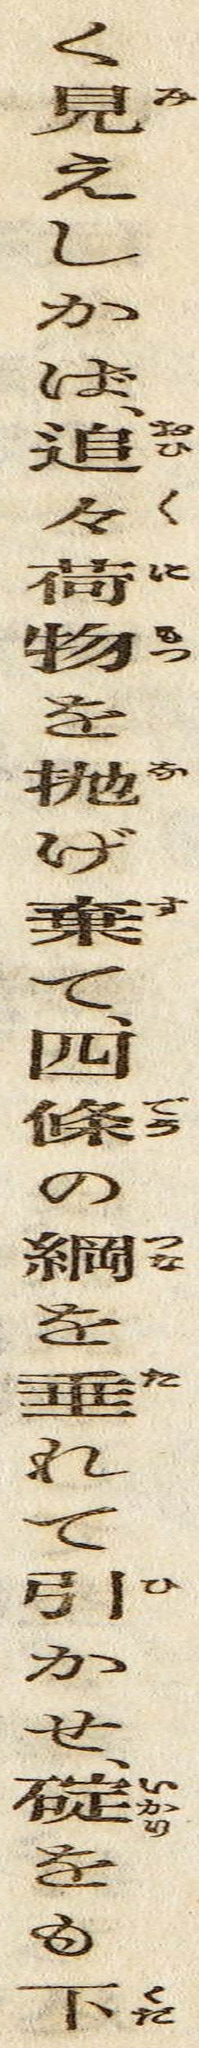く見えしかば、追々荷物を抛げ棄て、四條の綱を垂れて引かせ、碇をも下
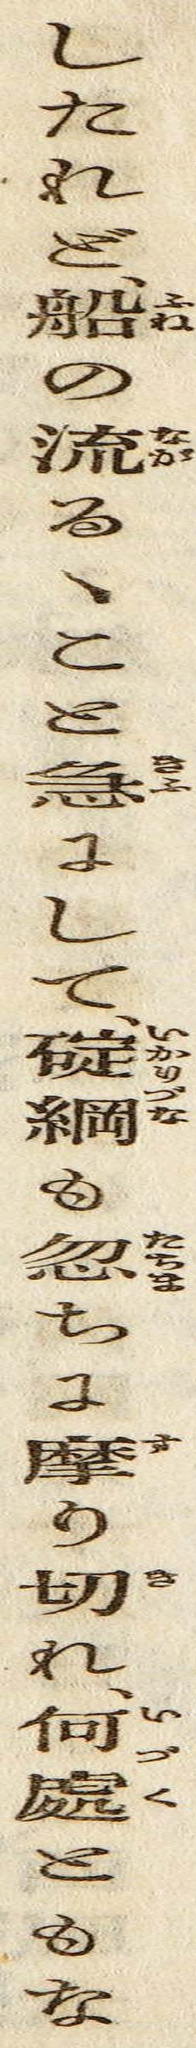したれど、船の流るゝこと急にして、碇綱も忽ちに摩り切れ、何処ともな
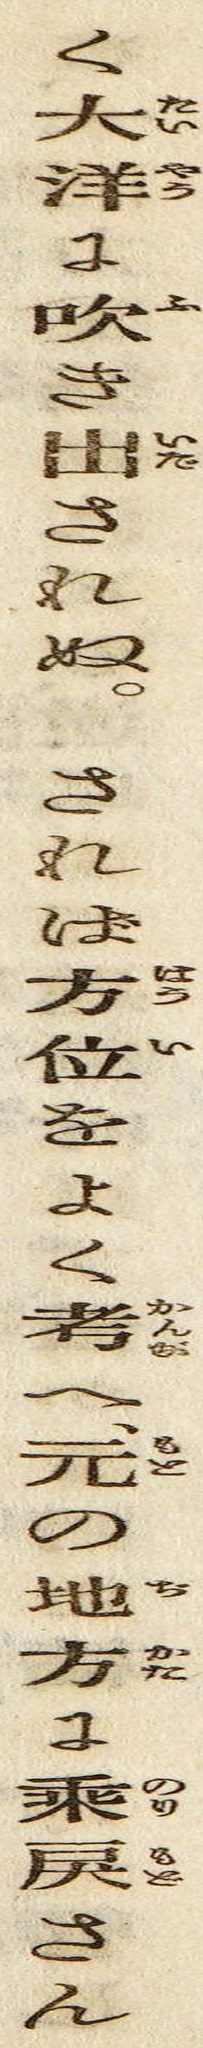く大洋に吹出されぬ。されば方位をよく考へ、元の地方に乗戻さん

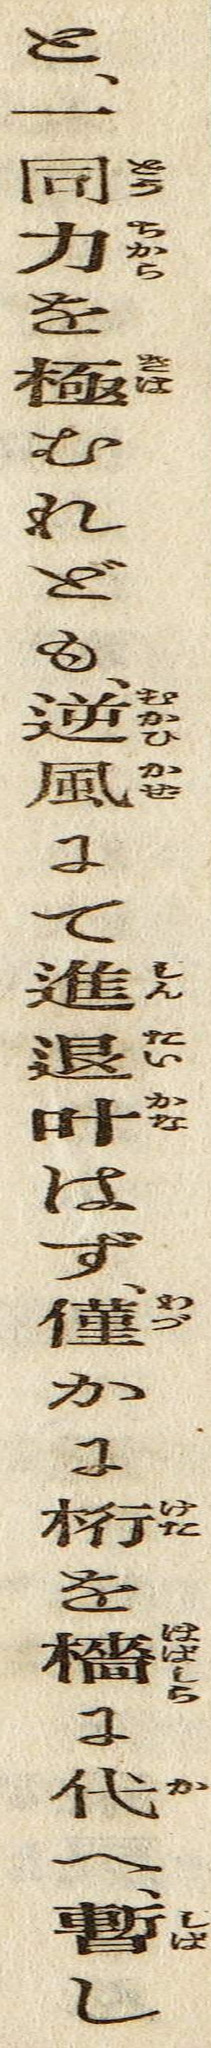と、一同力を極むれども、逆風にて進退叶はず、僅かに桁を檣に代へ暫し
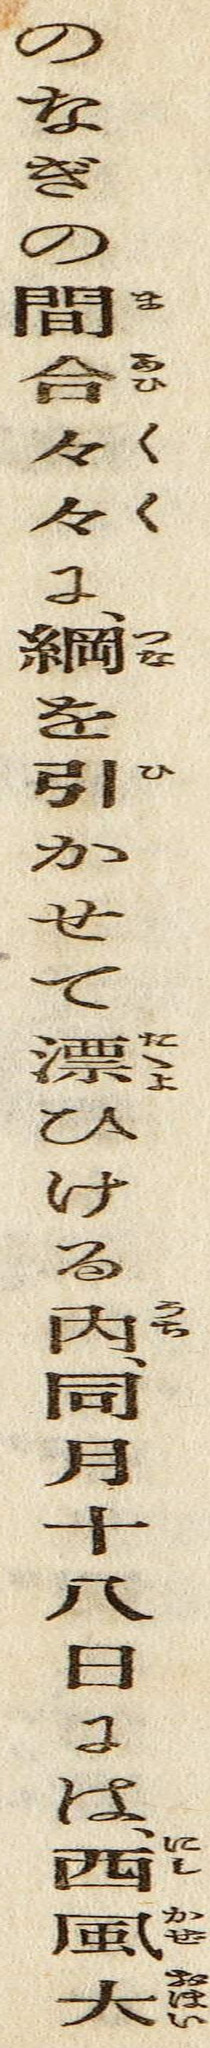のなぎの間合々々に、綱を引かせて漂ひける内同月十八日には、西風大
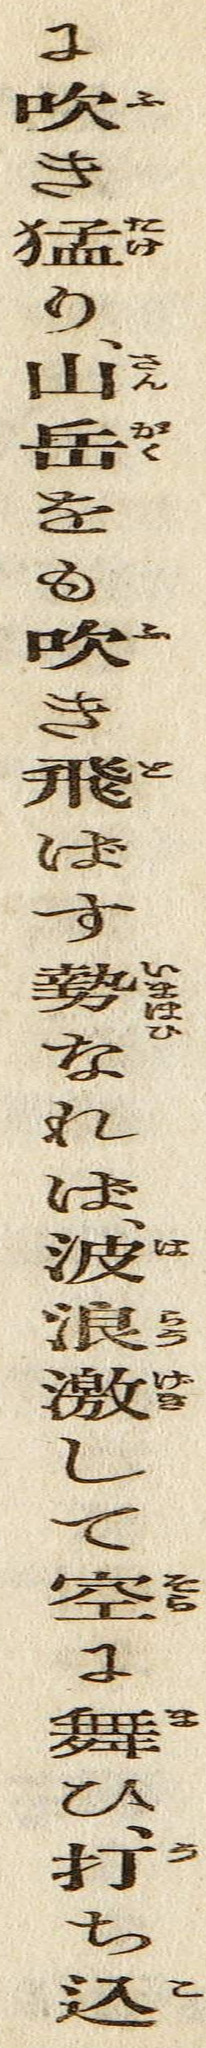に吹き猛り、山岳をも吹き飛ばす勢なれば、波浪激して空に舞ひ、打ち込
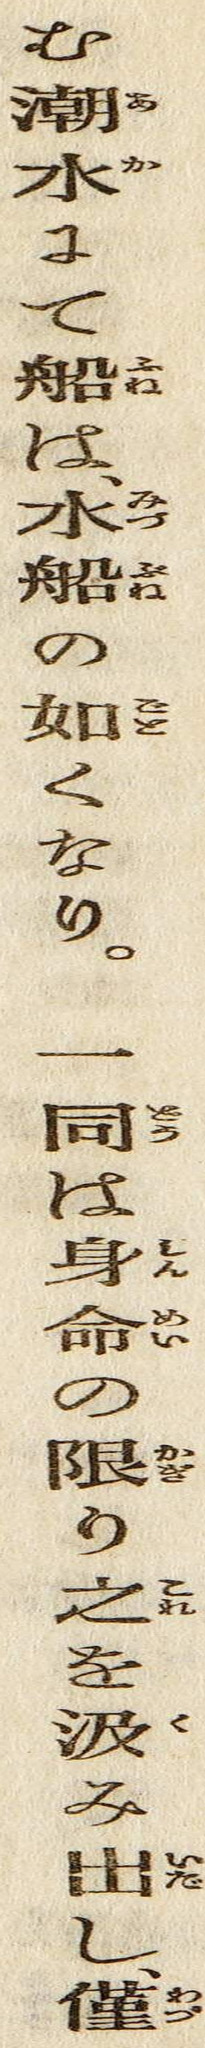む潮水にて船は、水船の如くなり。一同は身命の限り之を汲み出し、僅
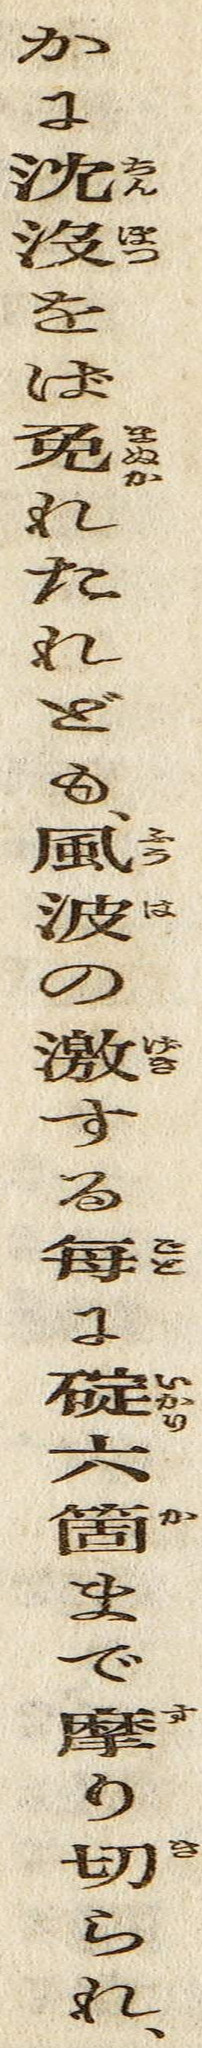かに沈没をば免れたれども、風波の激する毎に碇六個まです摩り切られ、
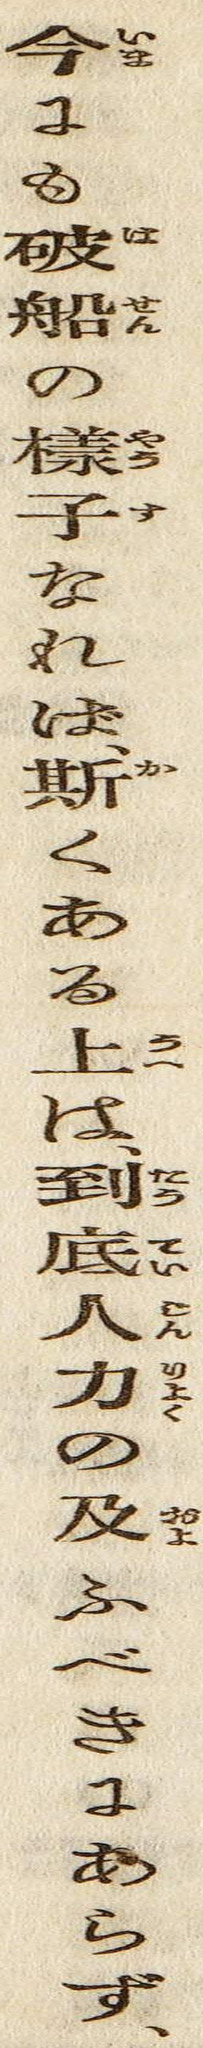今にも破船の様子なれば、斯くある上は到底人力の及ふべきにあらず、
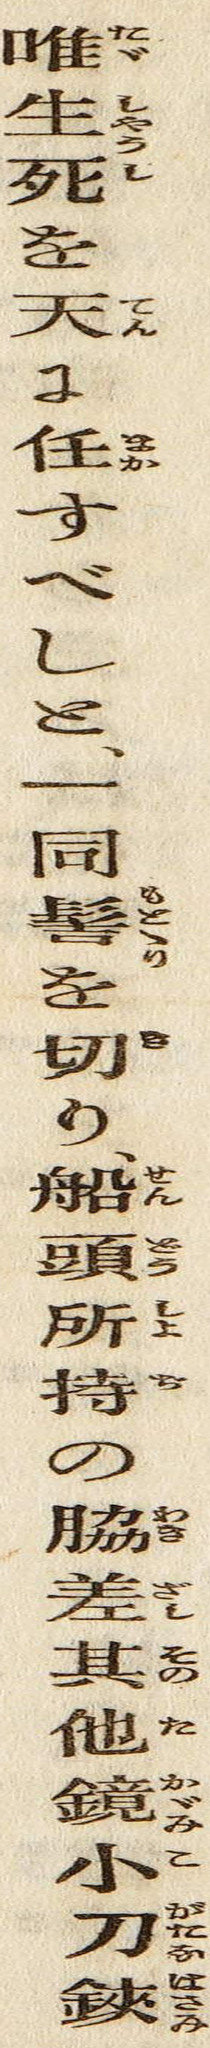唯生死を天に任すべしと、一同髻を切り、船頭所持の脇差其他鏡小刀小刀鋏
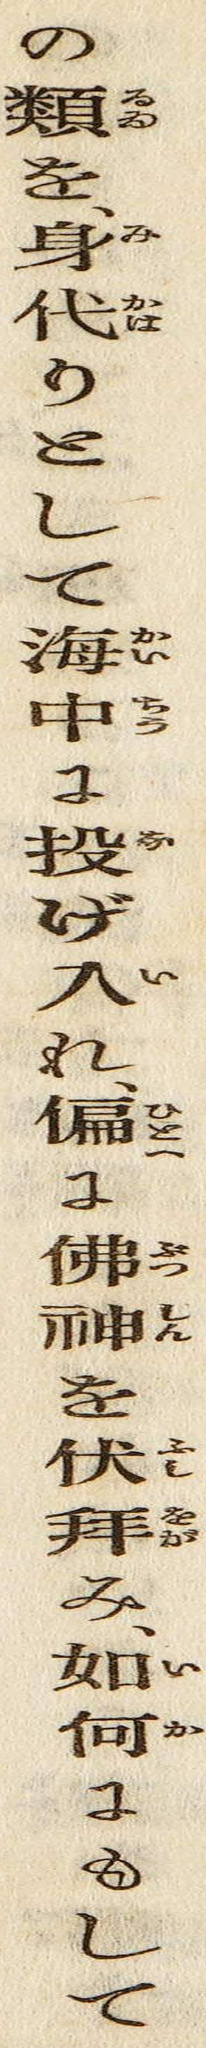の類を身代りとして海中に投げ入れ、偏に仏神を伏拝み、如何にもして
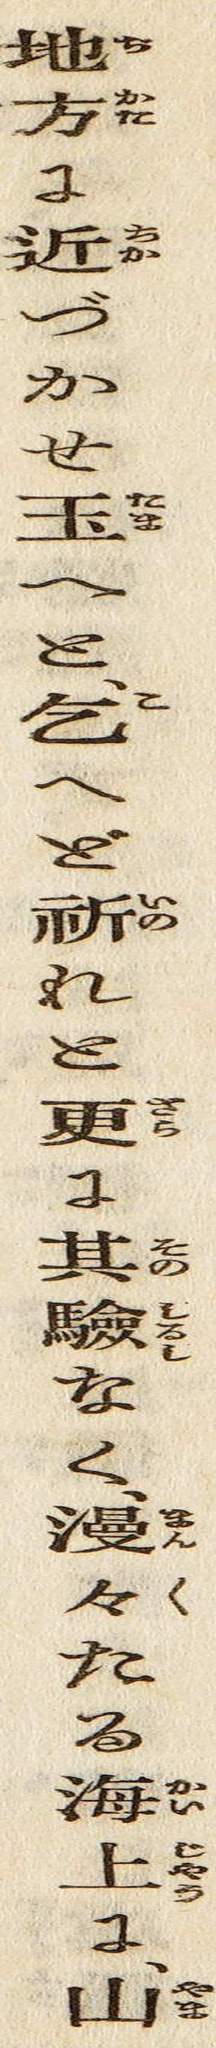地方に近づかせ玉へと乞へど祈れと更に其験なく、漫々たる海上に、山
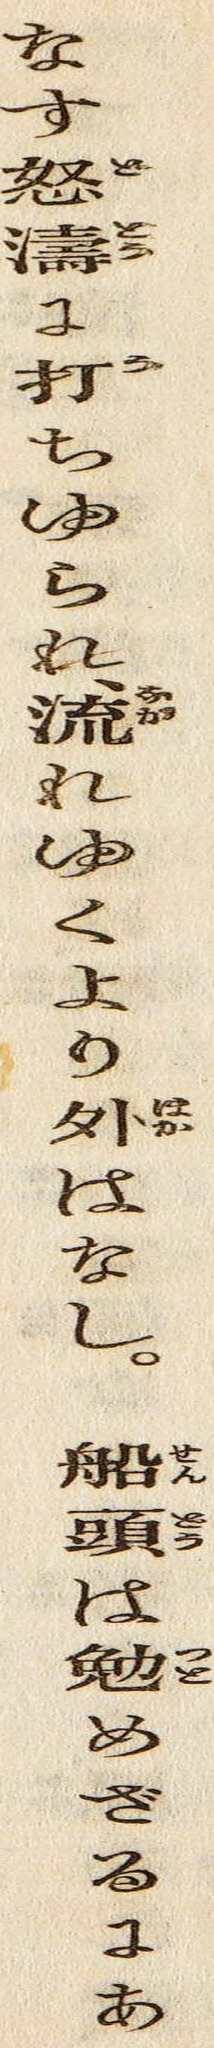なす怒涛に打ちゆられ、流れゆくより外はなし。船頭は勉めざるにあ
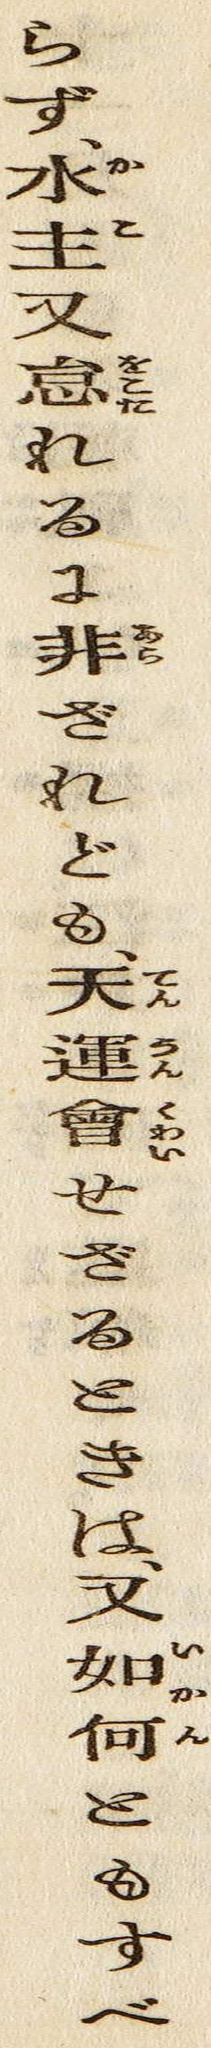らず、水主又怠れるに非ざれども、天運会せざるときは、又如何ともすべ
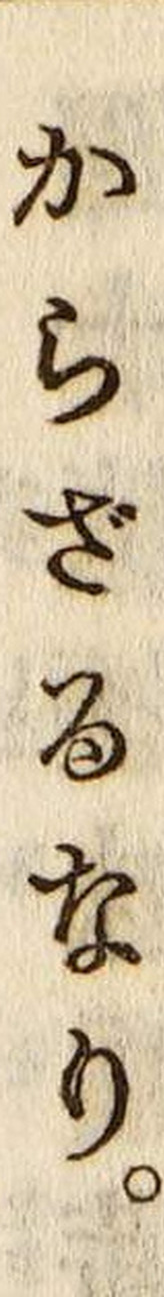からざるなり。

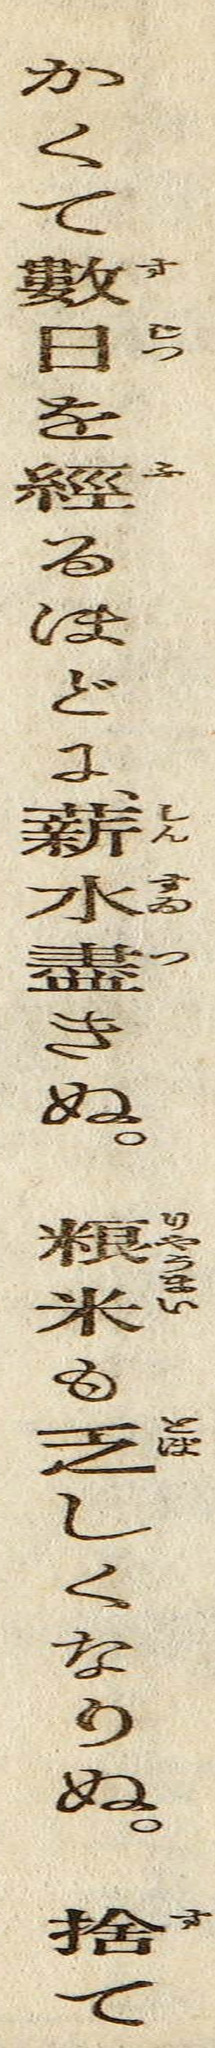かくて数日を経るほどに、薪水尽きぬ。糧米も乏しくなりぬ。捨て
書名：日本漂流譚
